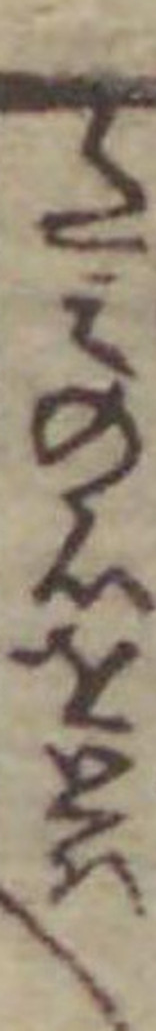たみの心をとは
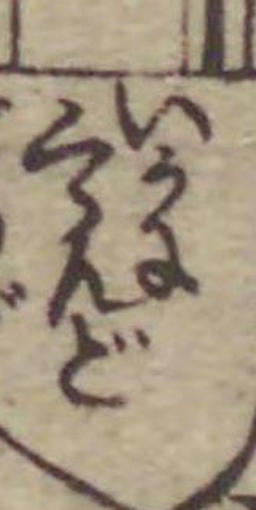くらんど
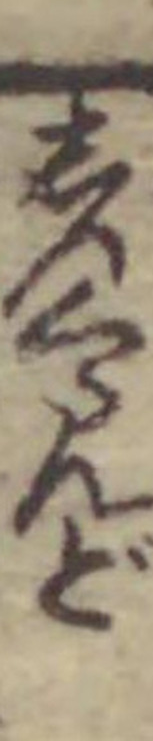しんくらんど
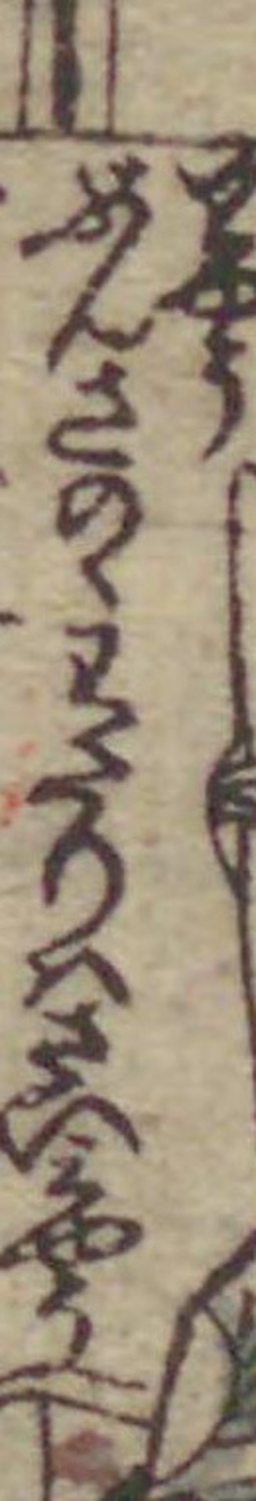ぶんさのゝわたりはさいみやう
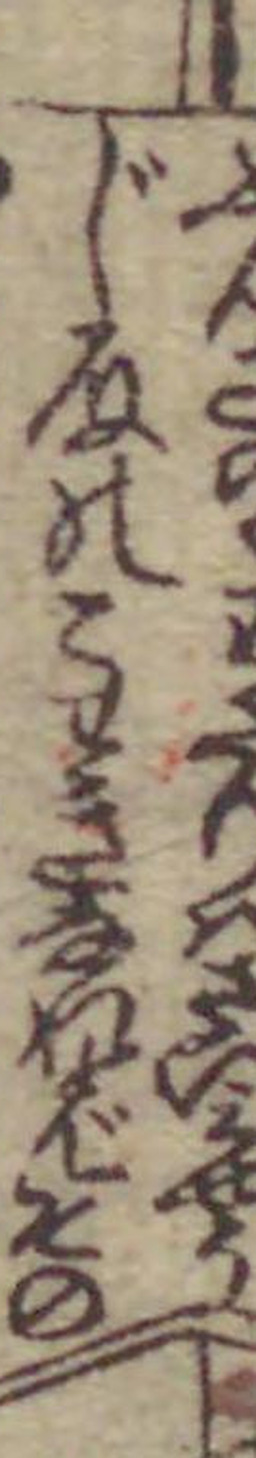じ殿のこせきなればその
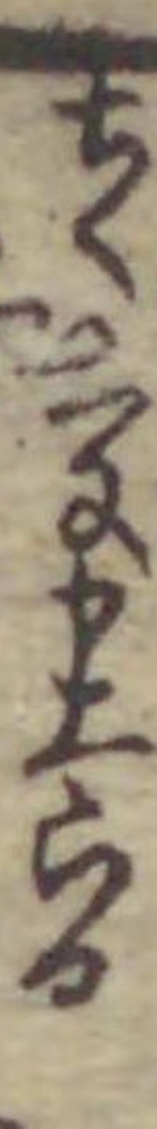ちく一に申上らる
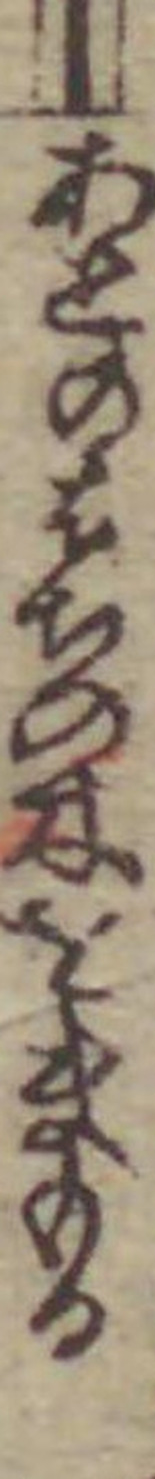あとのはちの木をまもる
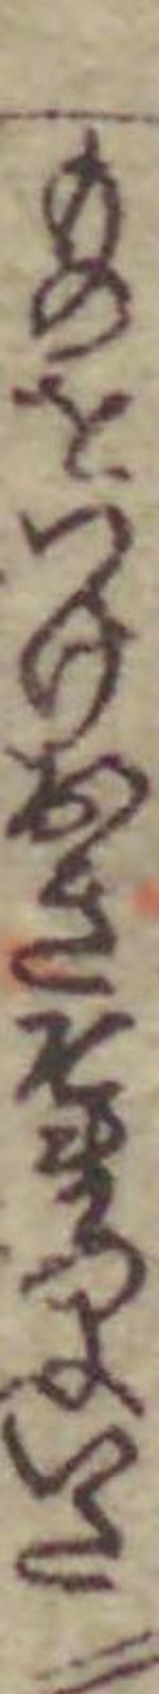ものをつけおきそまつにいた
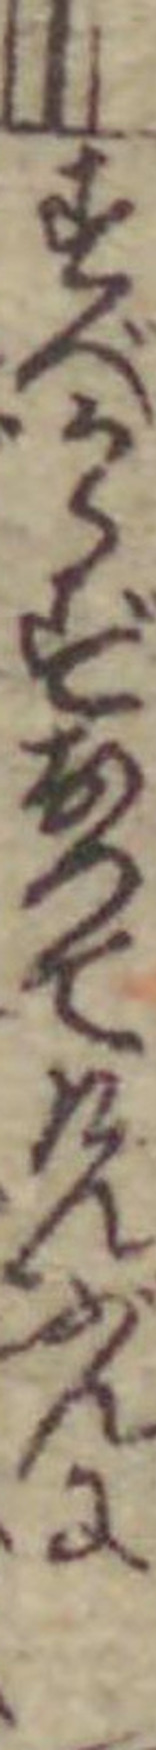すべからずおつてけんぶんに
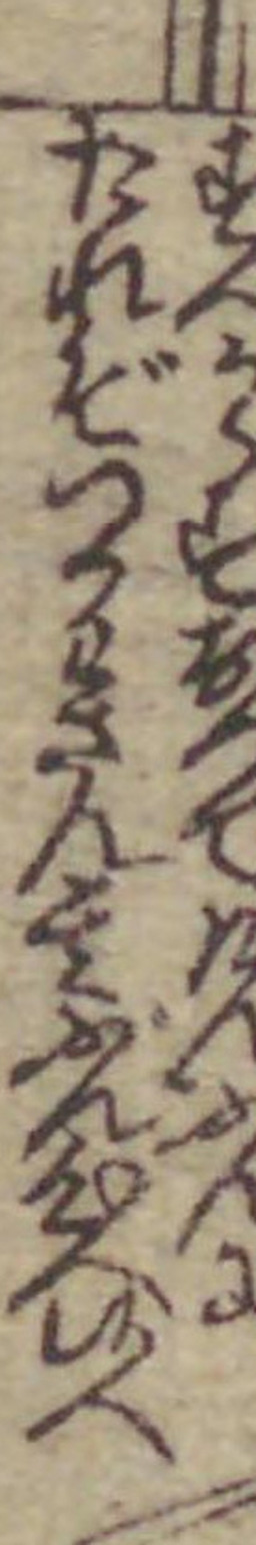たれぞつかわさん其ぶん心へ候へ
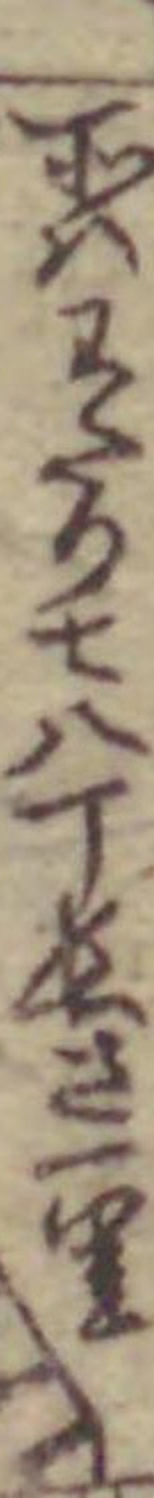所はわたり七八丁長さ一里
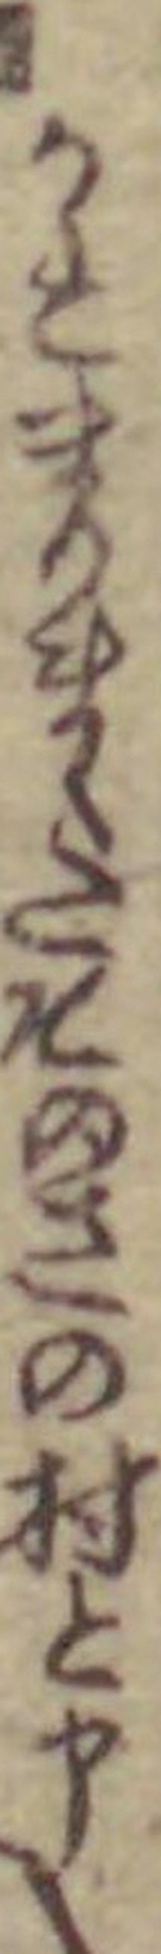かしこまりましたそのさの村と申
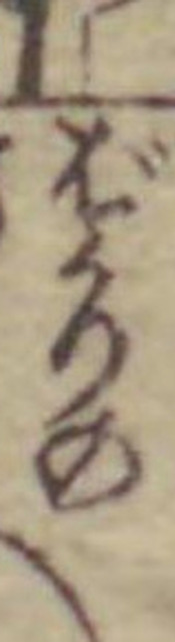ばかりの
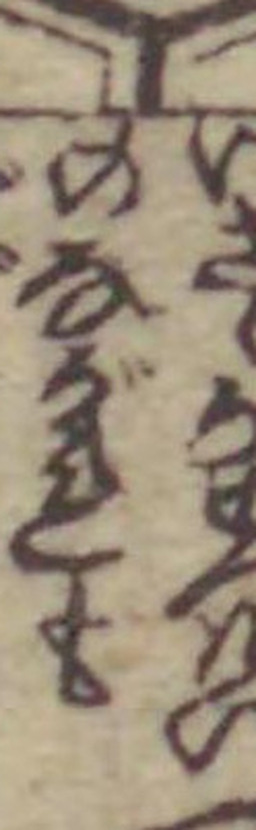のながれも
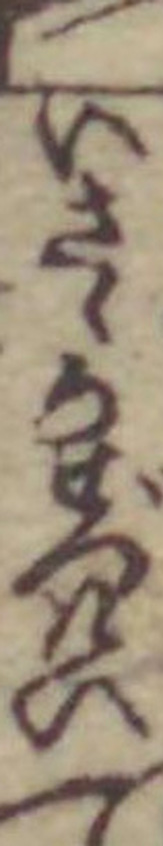いさゝかぜつけい
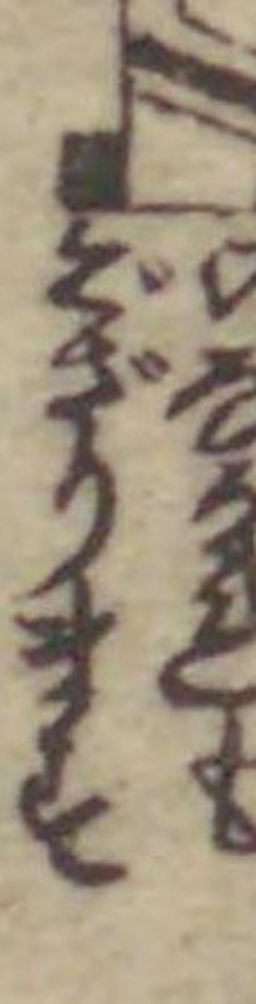ござります
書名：娜二代鉢木 5巻
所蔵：国立国会図書館 National Diet Library, JAPAN
